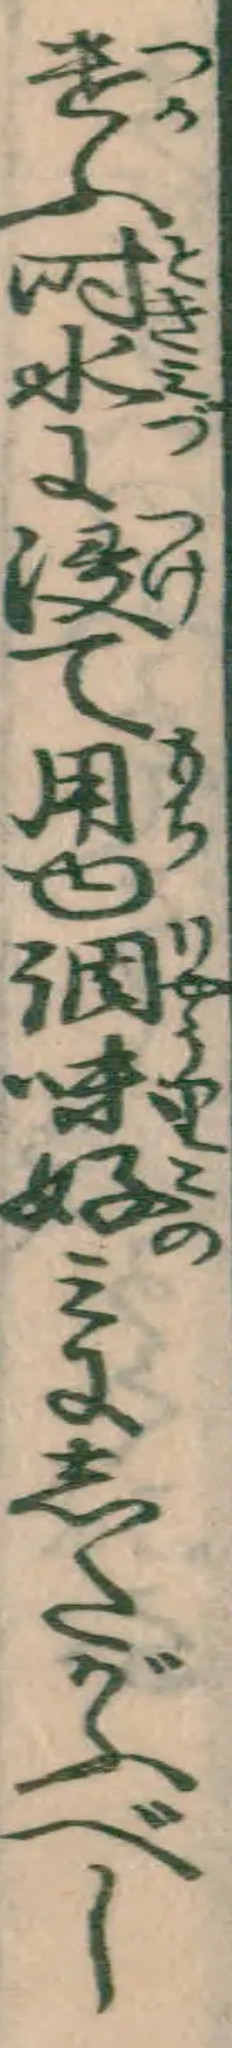遣ふ時水に浸て用ゆ調味好みにしたがふべし
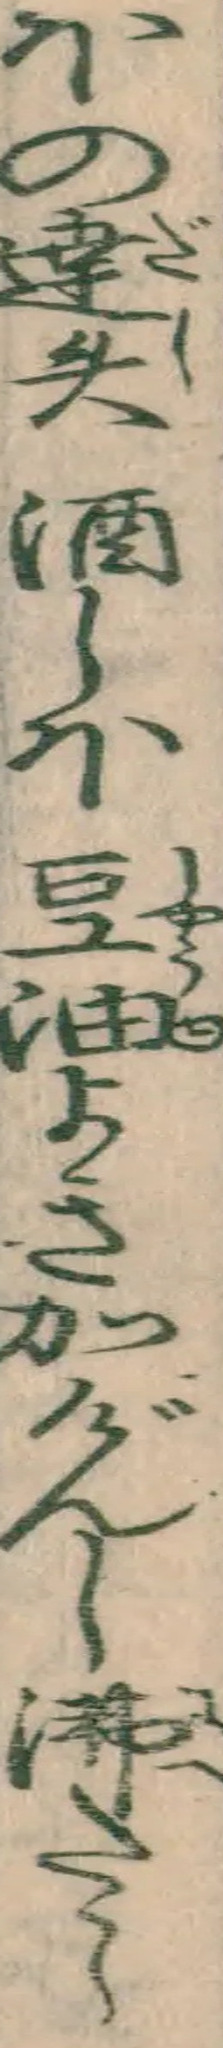ほの達失酒しほ豆油よきかげんし沸たゝし
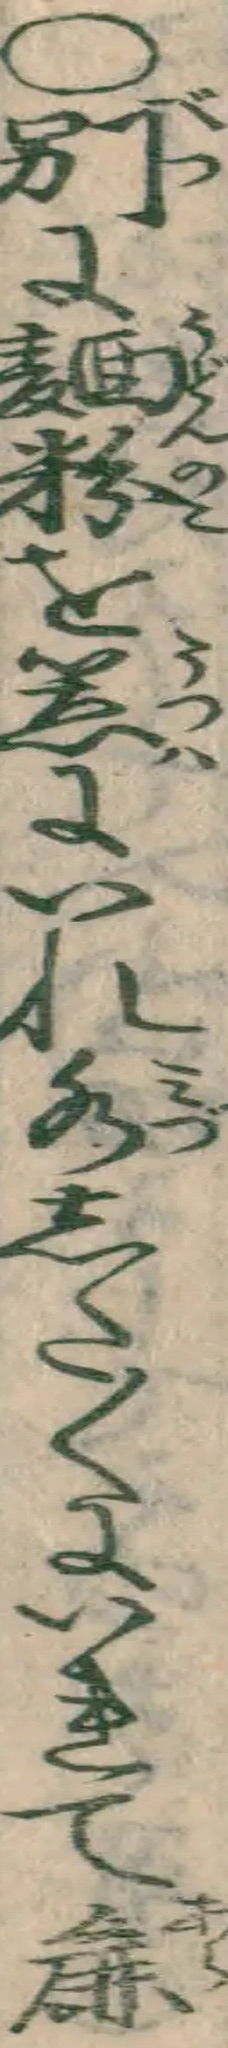○別に麺粉を器にいれ水した〳〵にいれて麁
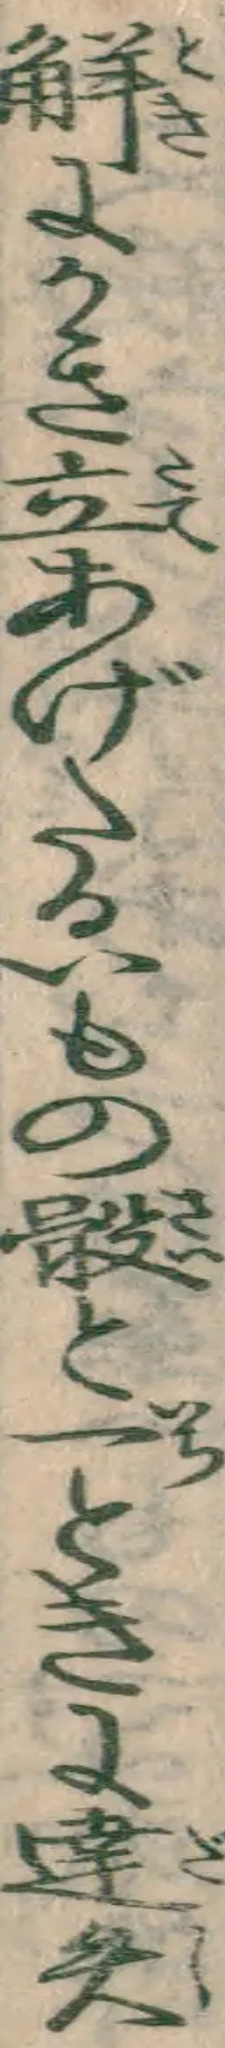解にかき立あげたるいもの骰と一ときに達失
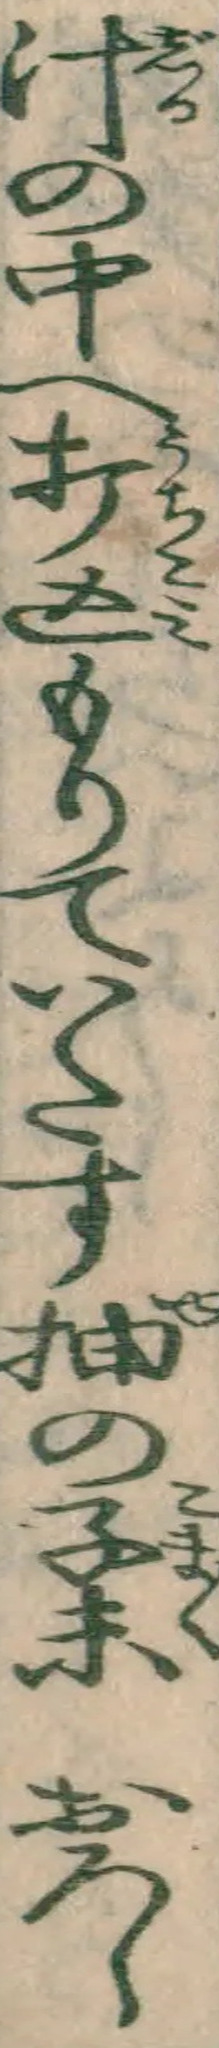汁の中へ打込もりていたす柚の子末おろし
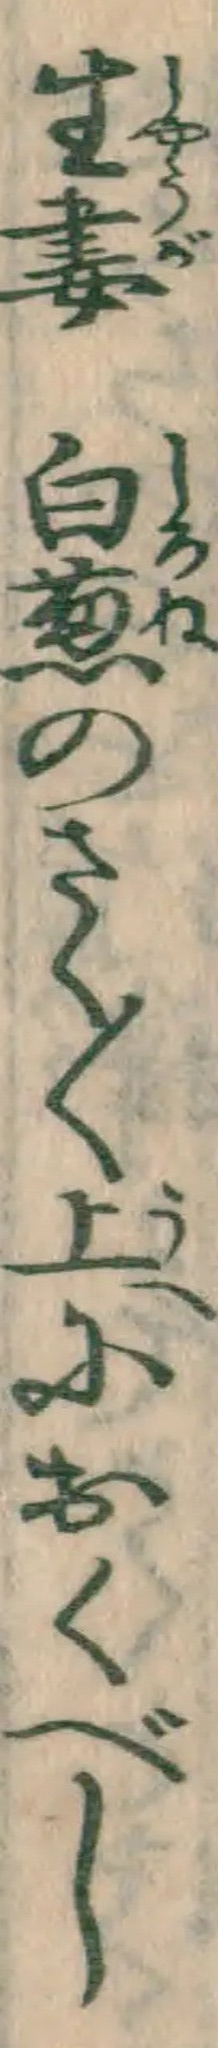生姜白葱のさく〳〵上におくべし

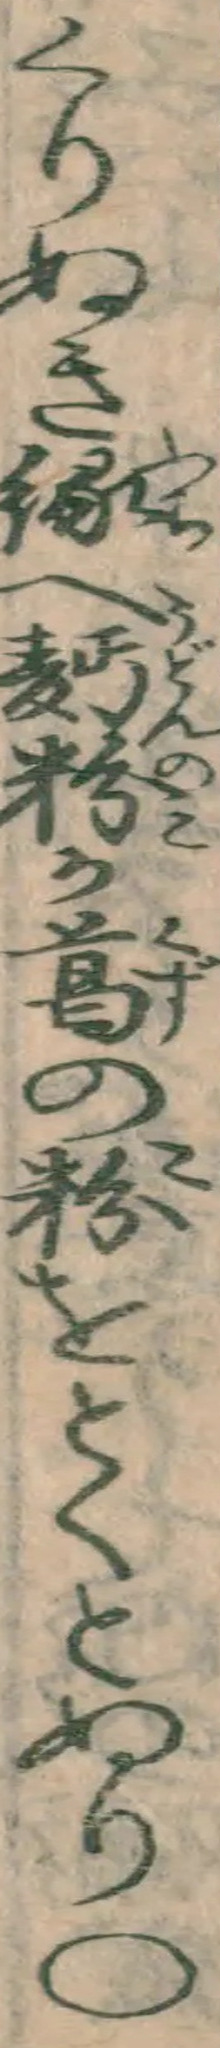くりぬき縁へ麪粉か葛の粉をとくとぬり◯
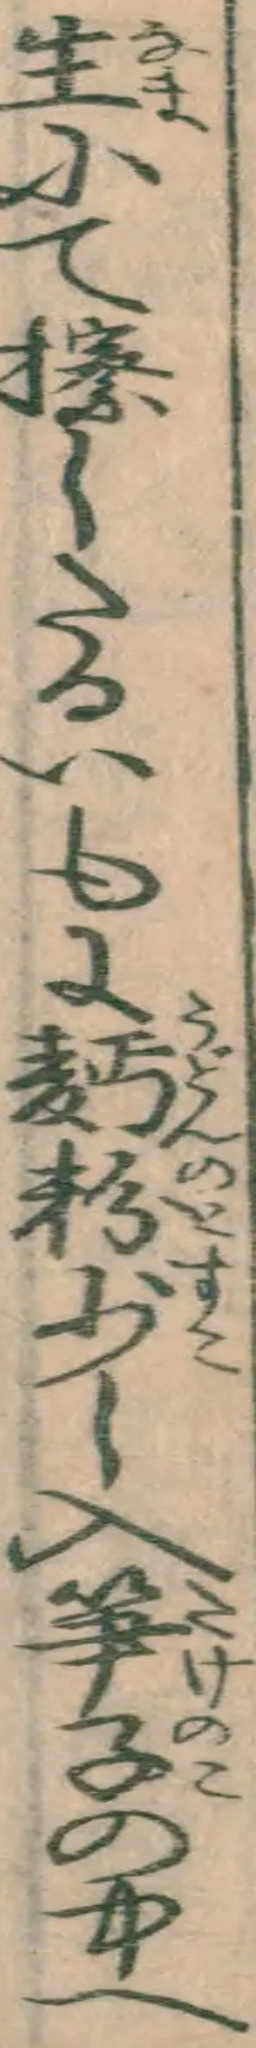生にて擦したるいもに麪粉少し入笋子の中へ
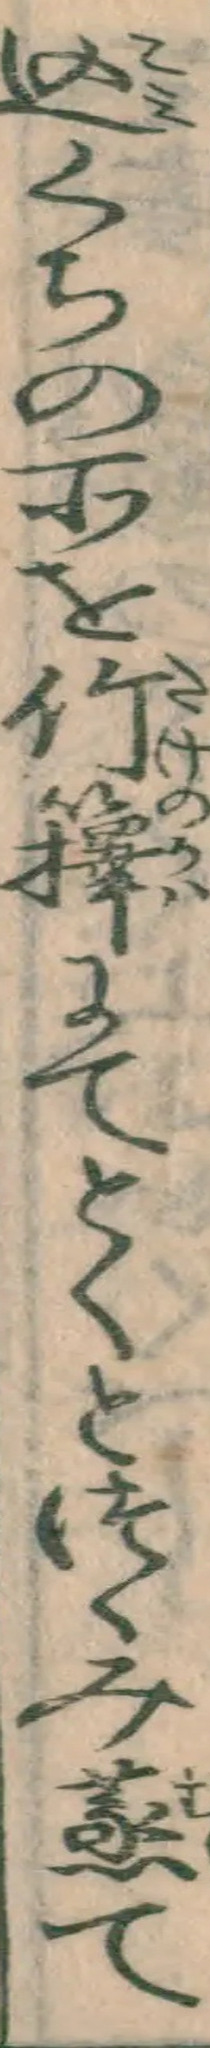込くちの所を竹籜にてとくとつゝみ蒸て
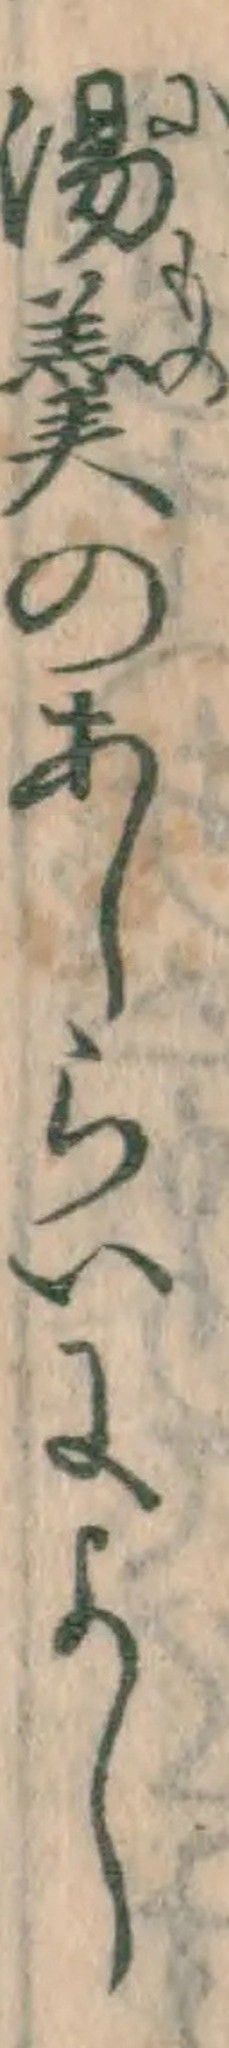湯羹のあしらいによし
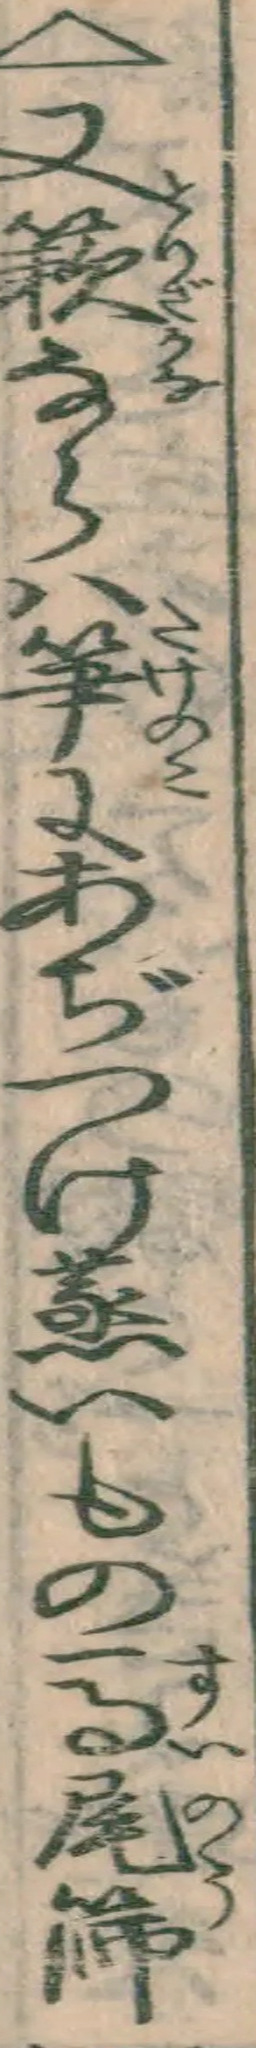△又簌ならは笋にあぢつけ蒸いもの馬尾篩
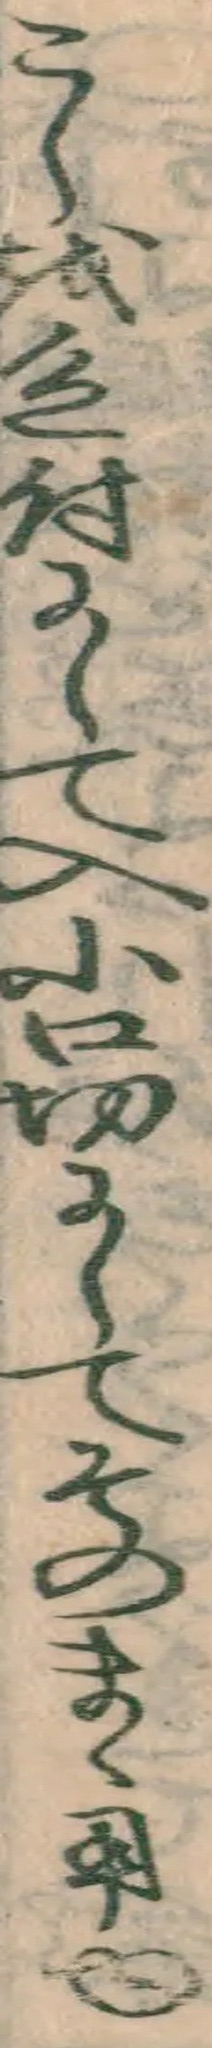こしを色付にして入小口切にしてそのまゝ用ゆ
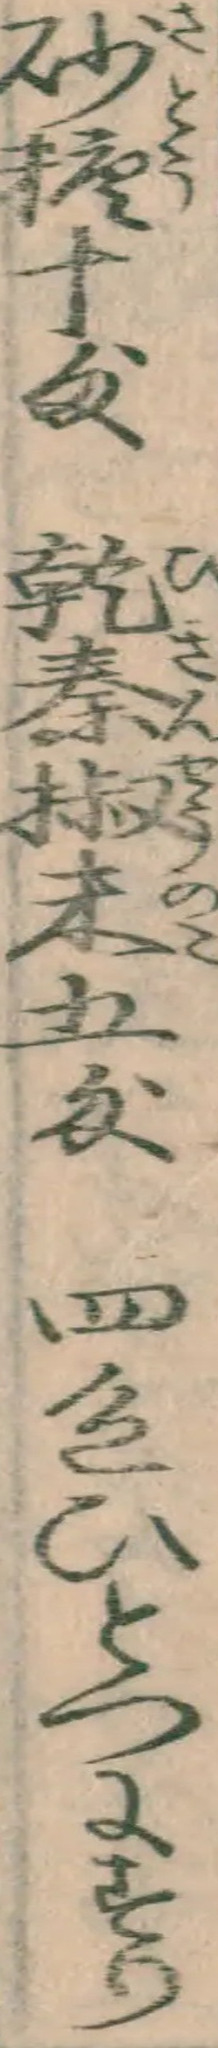砂糖十匁乾奏椒末五匁四色ひとつにすり
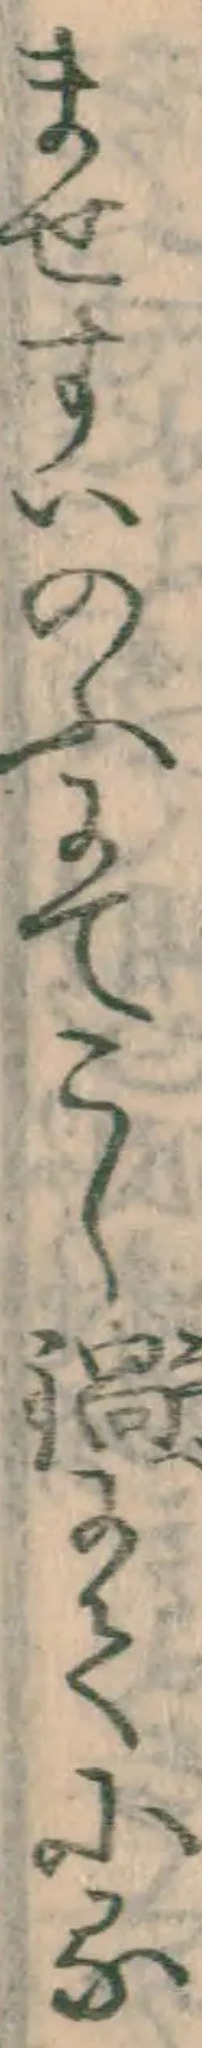ませすいのふにてこし鍋にてにる
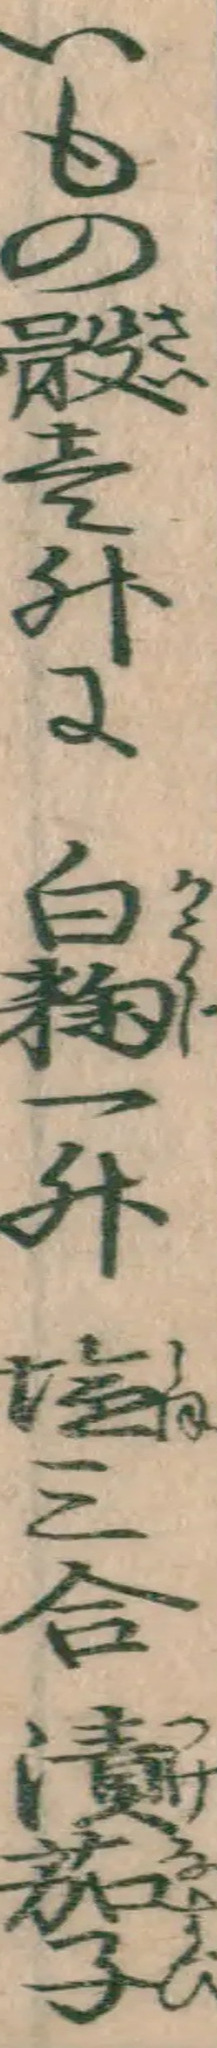いもの骰壱升に白粷一升塩三合漬茄子
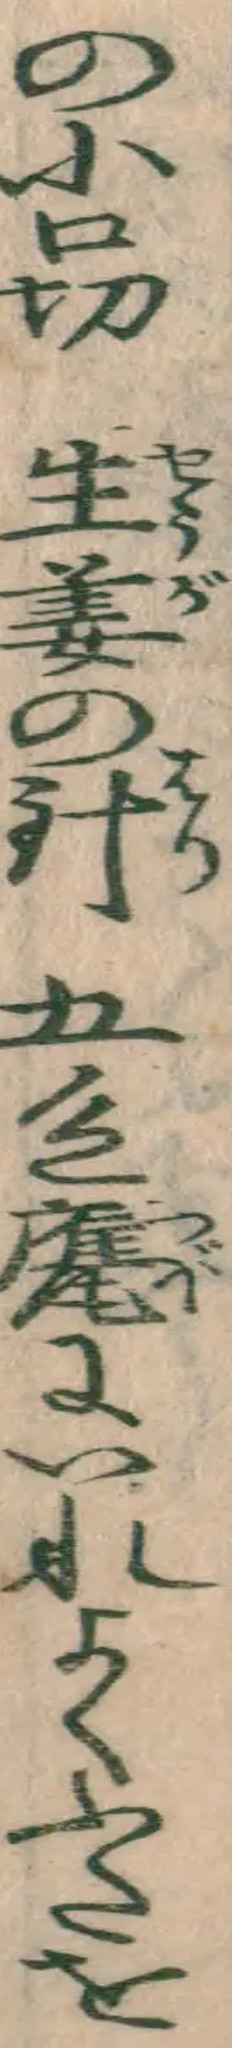の小口切生姜の針五色甕にいれよくふたを
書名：甘藷百珍
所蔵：国立国会図書館 National Diet Library, JAPAN
